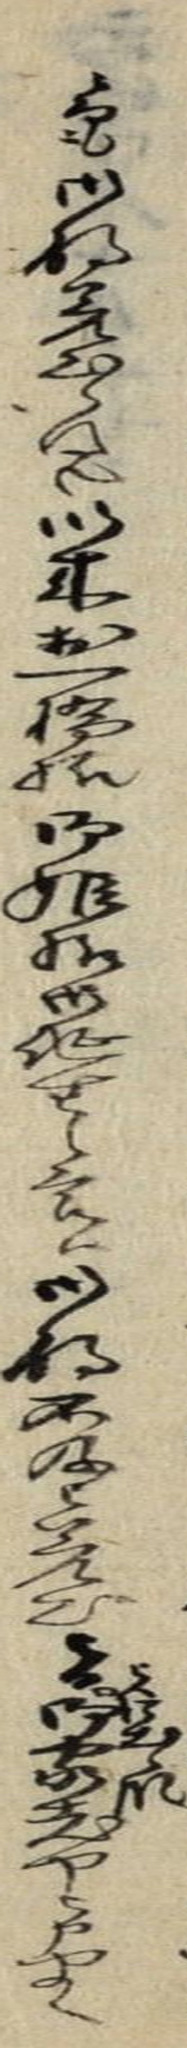に而も御触差出候得共以来於一橋様御姫様御誕生之節は御触不及被差出旨被仰出候段御家老中被申聞候
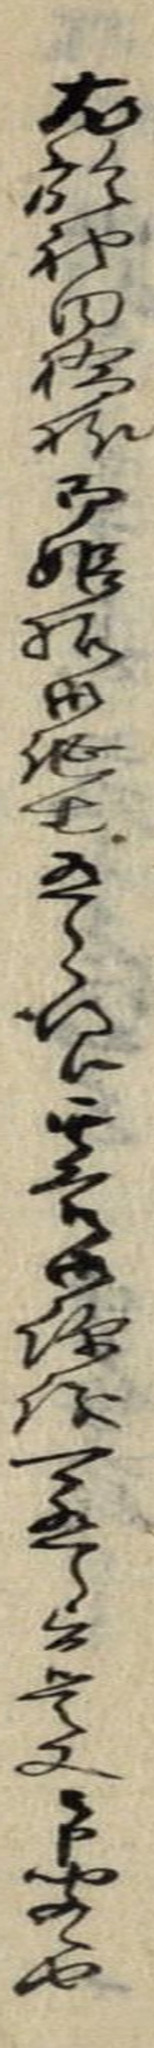右於神田橋様百姫様御誕生有之候得は其節御評議可有之旨被申聞候由
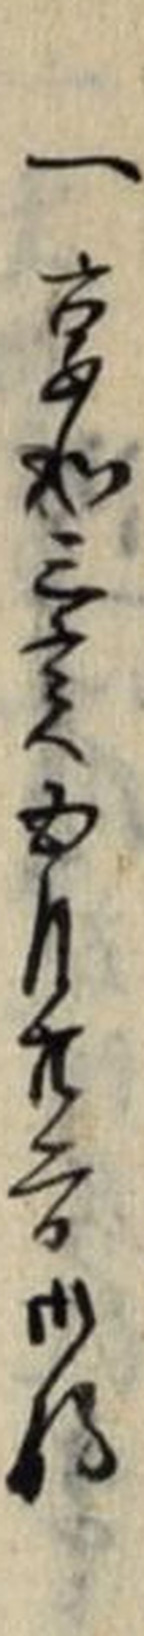一享和三亥五月廿二日御触
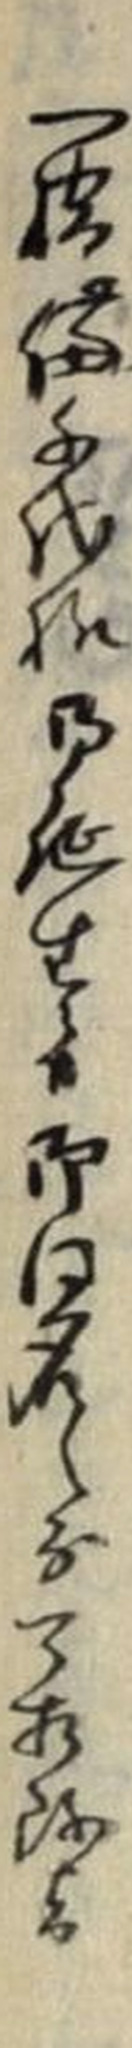一橋備千代様御誕生に付御同名之分可相改旨
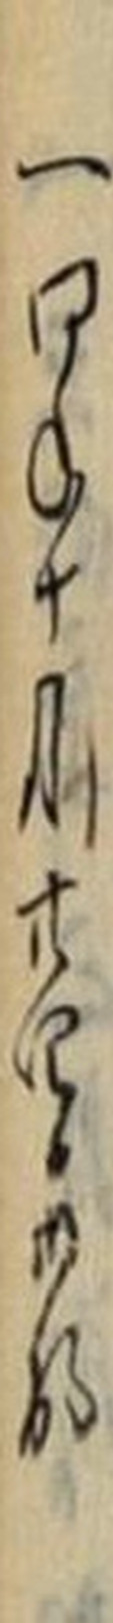一同年十月廿四日御触
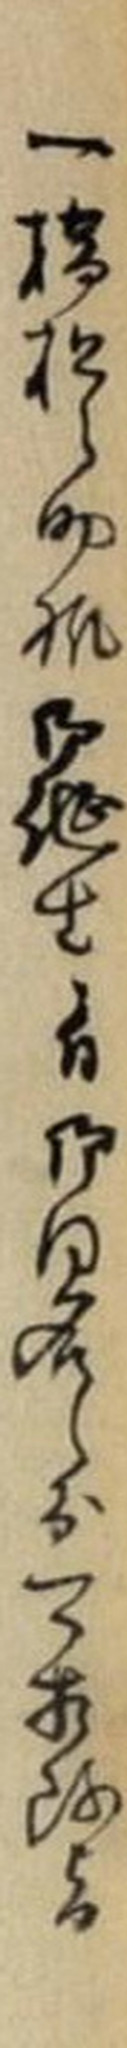一橋松之助様御誕生に付御同名之分可相改旨
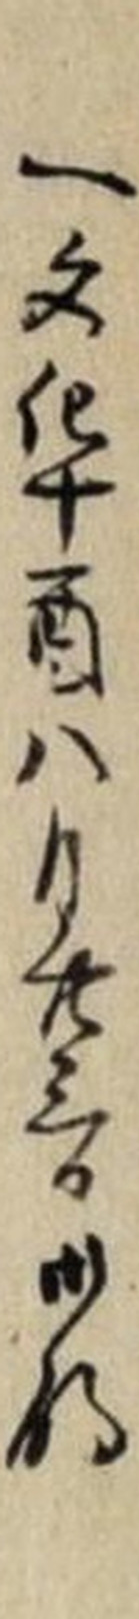一文化十酉八月廿三日御触
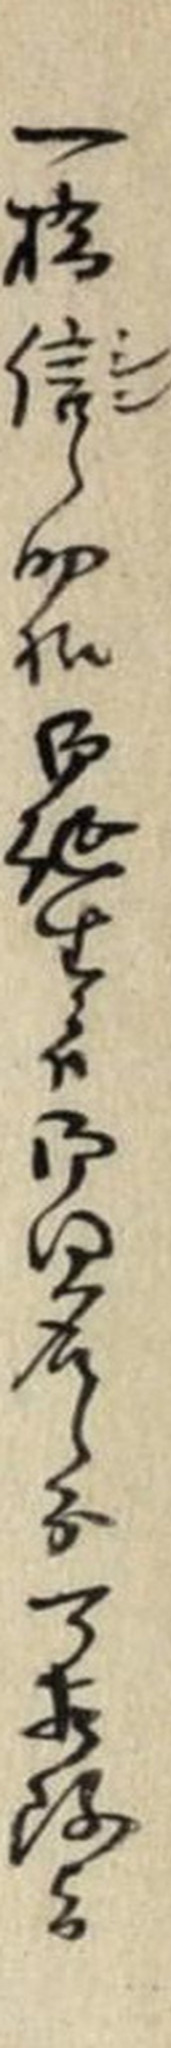一橋信之助様御誕生に付御同名之分可相改旨
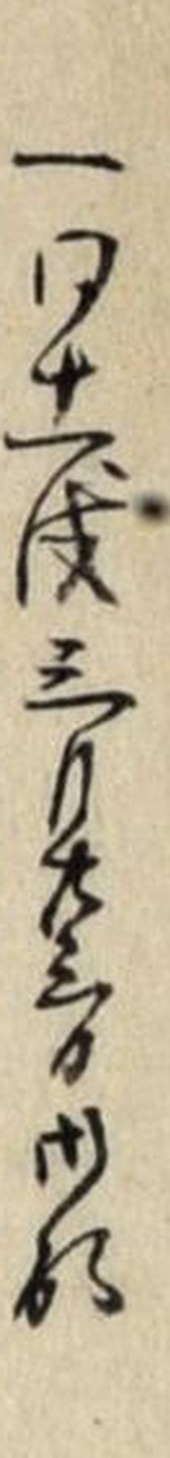一同十一戌三月廿三日御触
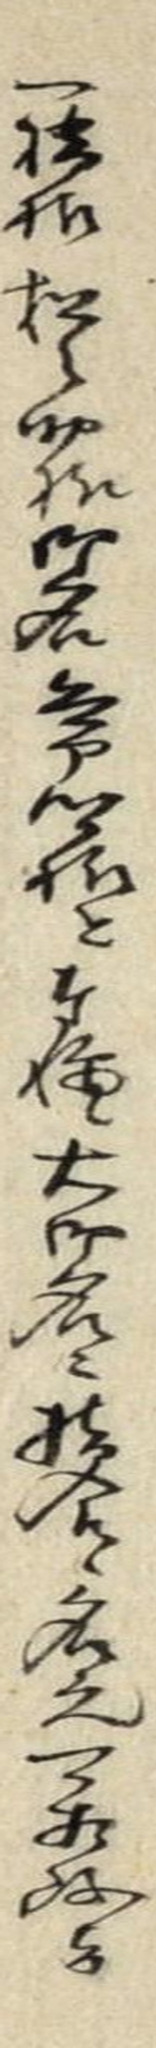一橋様松之助様御名兵部卿様と奉称候右御名に指合候名元可相改旨
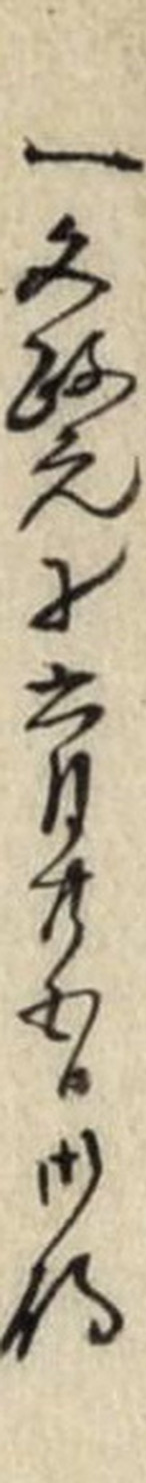一文政元寅六月廿五日御触
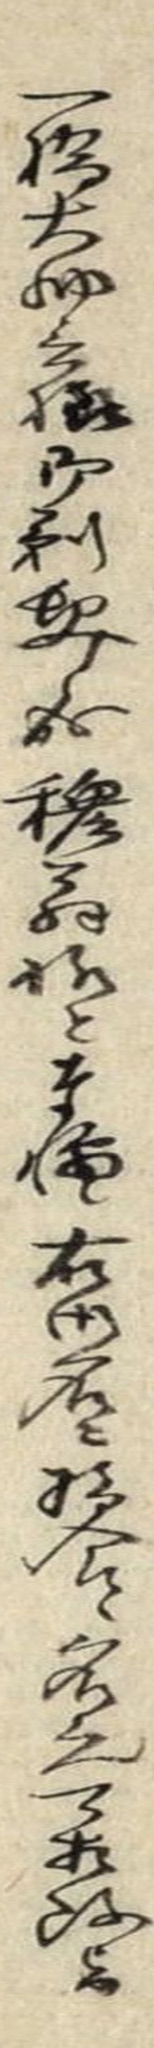一橋大納言様御剃髪被成穆翁様と奉称候右御名に指合候名元可相改旨
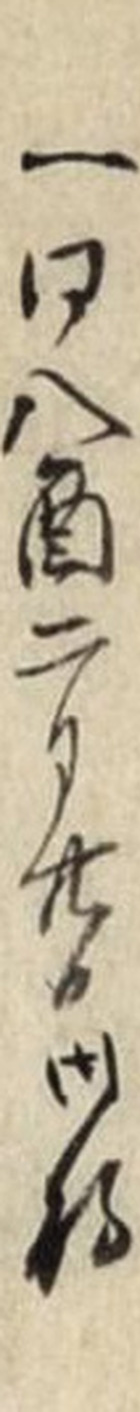一同八酉二月廿日御触
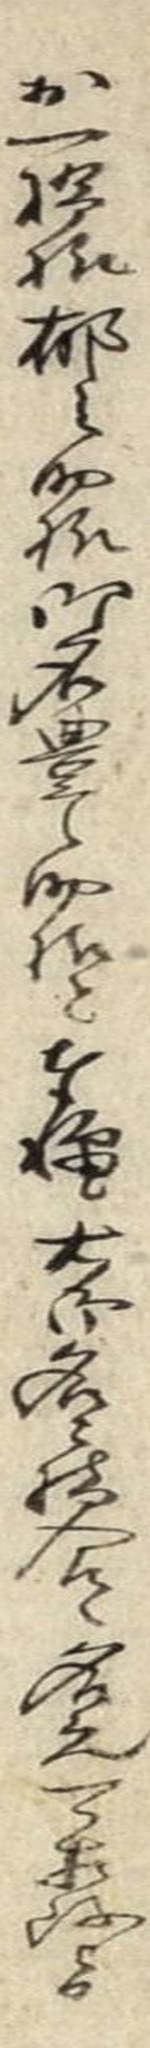於一橋様郁之助様御名豊之助様と奉称候右御名に指合候名元可相改旨
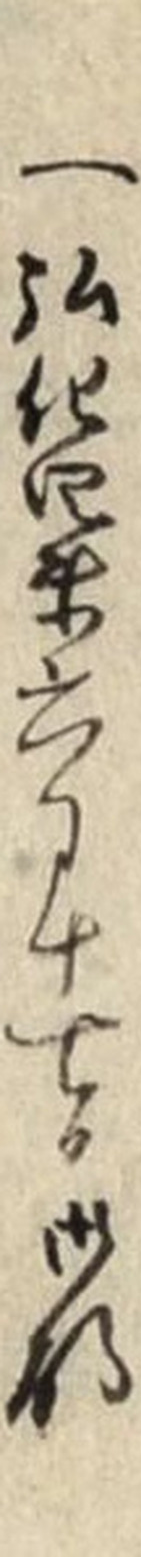一弘化四未六月十七日御触
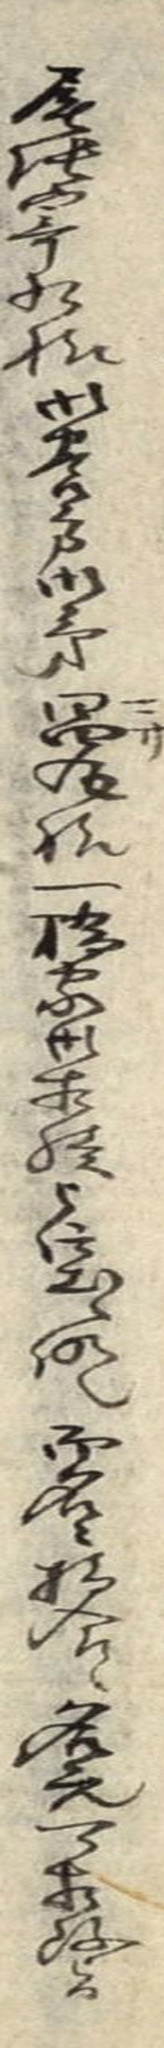尾張宰相様御養方御弟昌丸様一橋家御相続被仰出候仍之御名に指合候名元可相改旨
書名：蒐輯之部
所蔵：福井県文書館 Fukui Prefectural Archives
